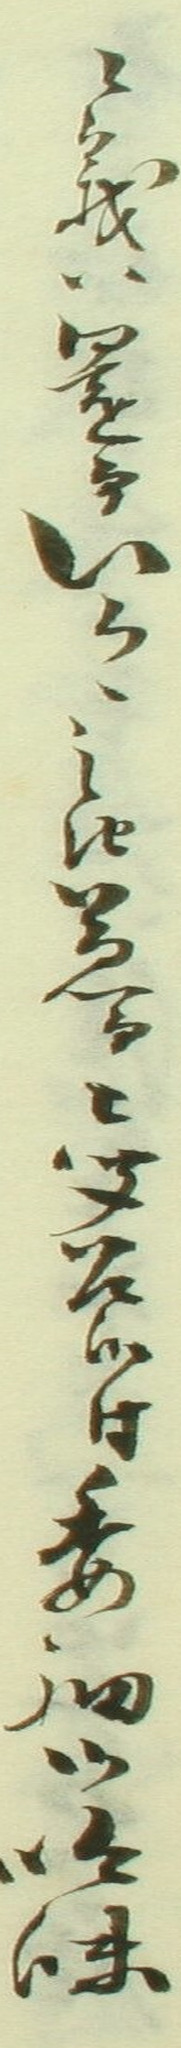候義ハ還而いかゝ之由兼而被聞召候付委細御吟味
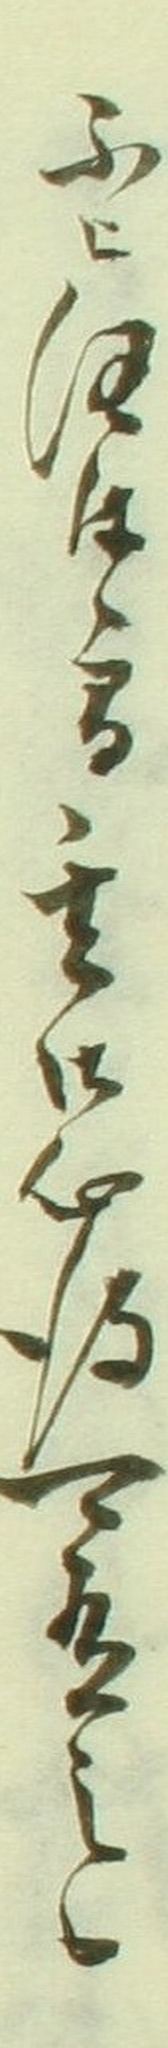不被任付候間其御心得可有之候
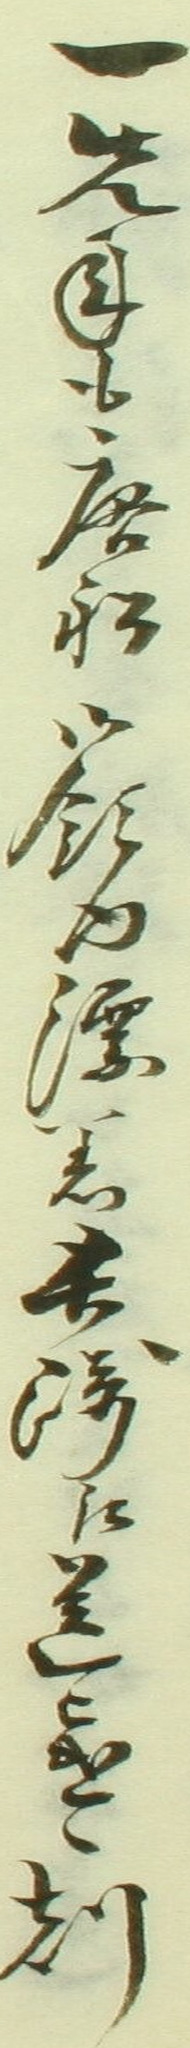一先年も唐船御領内漂着長崎江送被遣候刻
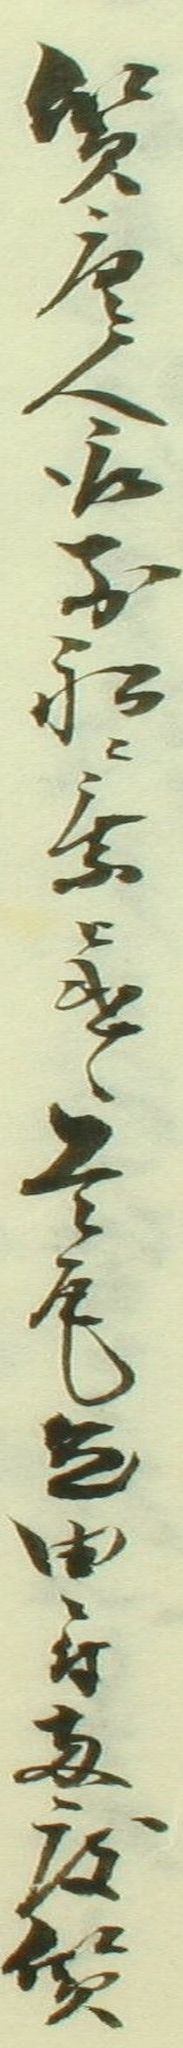質唐人取別船ニ乗被遣候首尾宜由ニ付両度質
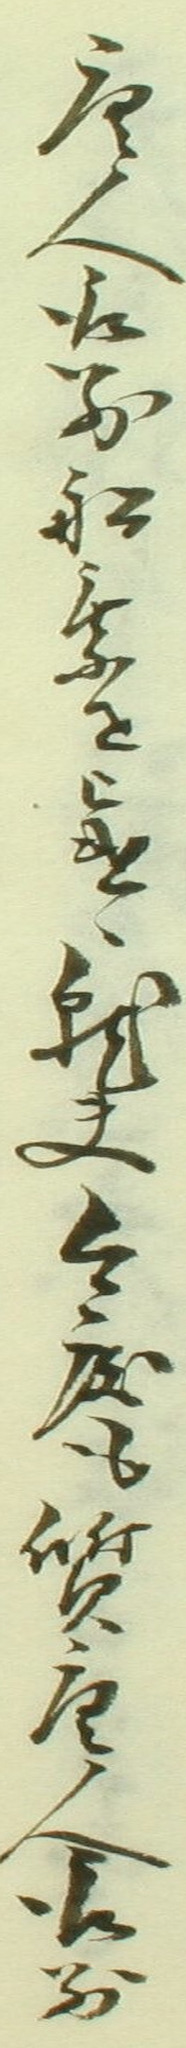唐人取別船乗せ被遣候就夫今度も質唐人取別
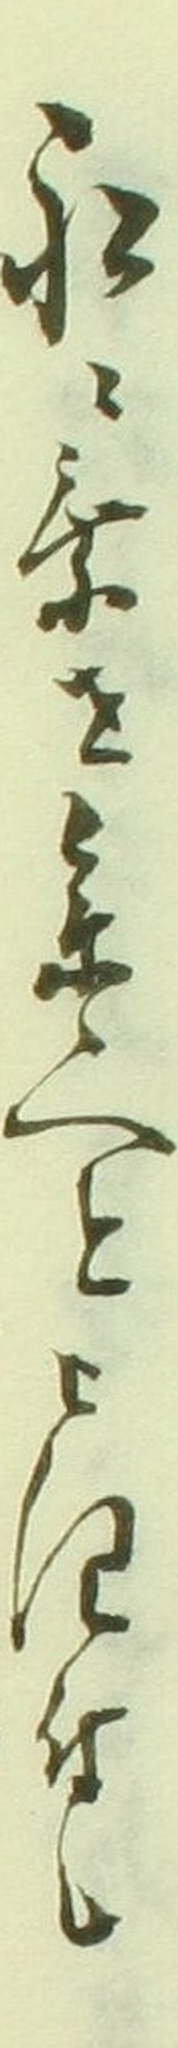船ニ乗せ参候へと被記付候
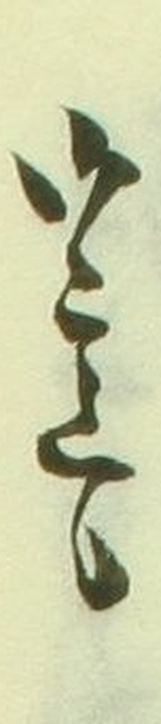御意候
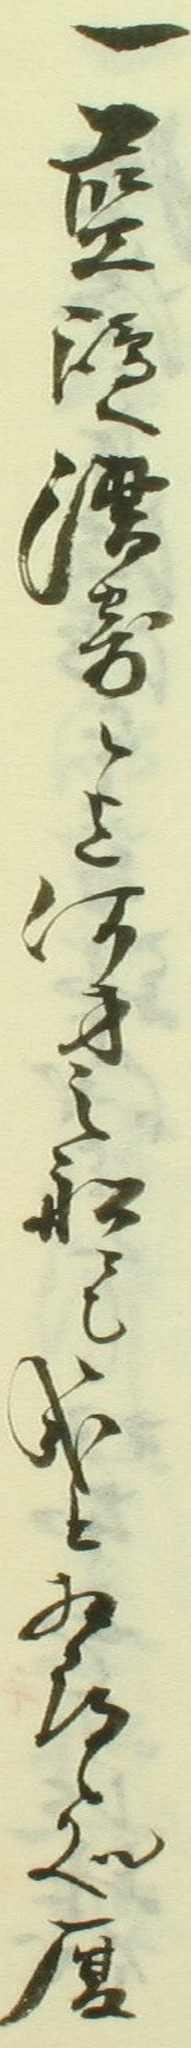一藍嶋へ漕寄候迄何方之船にて候哉と相尋候処厦
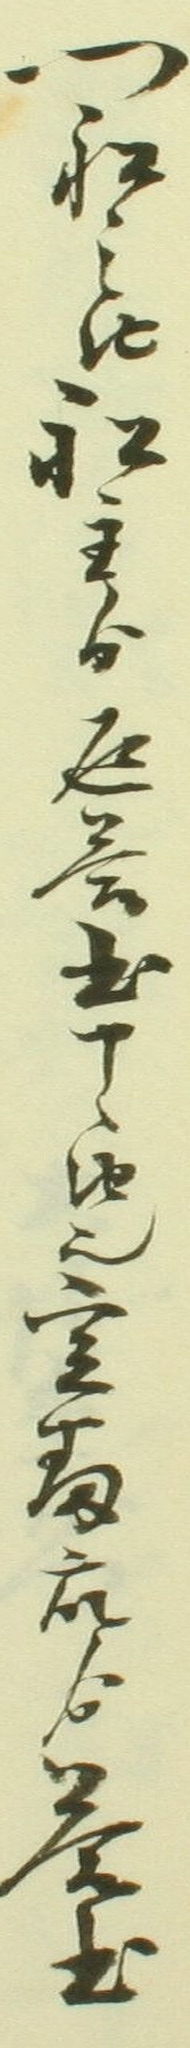門船之由船主ゟ返答書申候由也定番衆ゟ答書
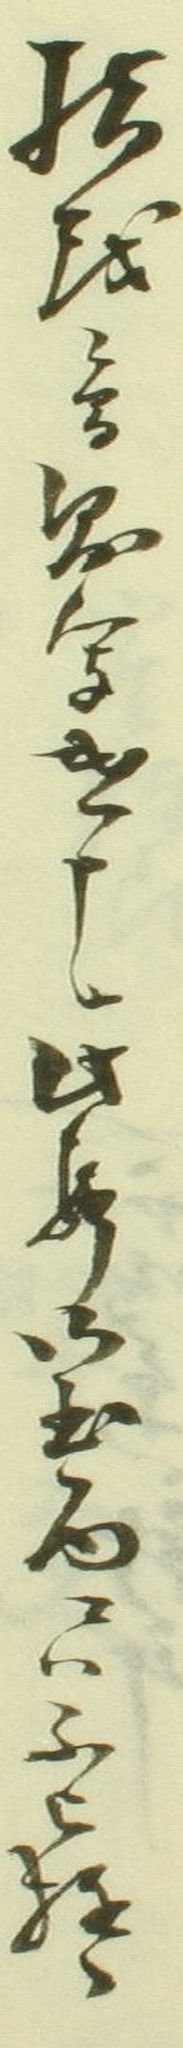指越候間則写遣申候此段御書面ニハ不被遊候
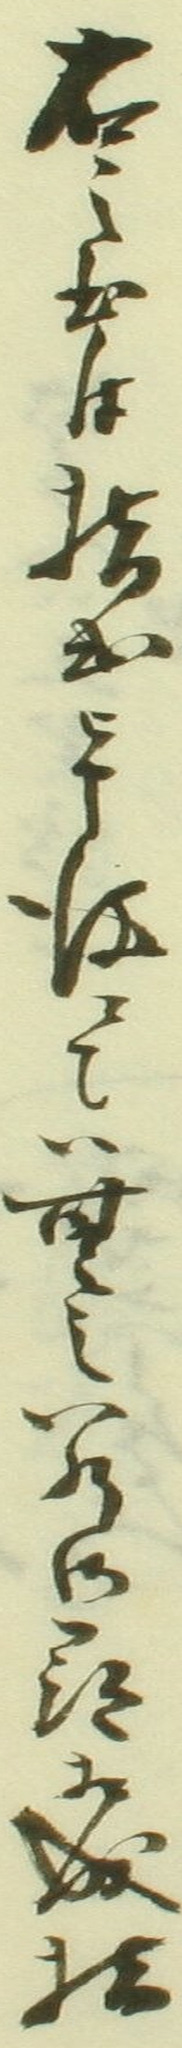右之書付指出被申儀ニてハ無之若御尋相成指
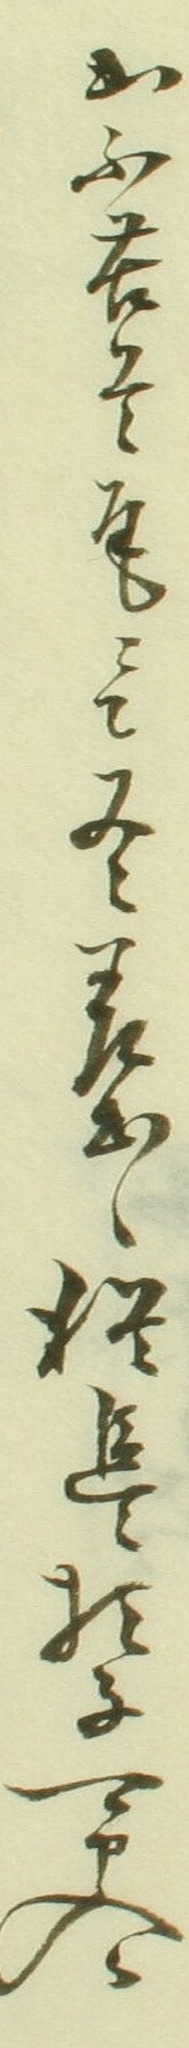出不苦首尾ニて又々差出候猶追々様子可申入候
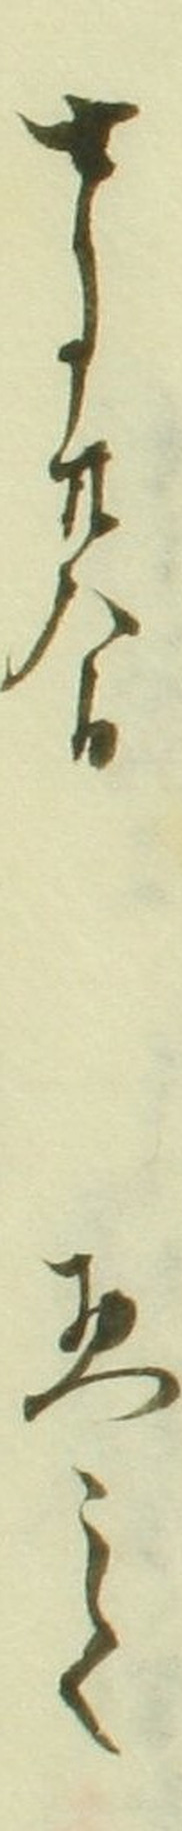七月廿八日右衛門
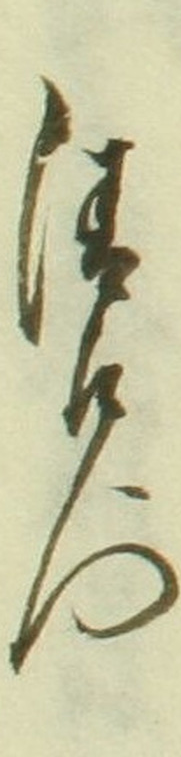清左衛門
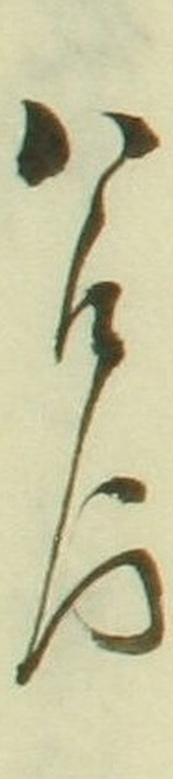八左衛門
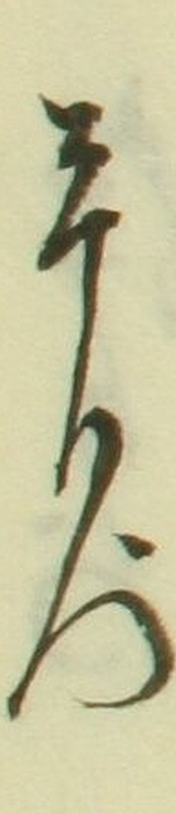平左衛門
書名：異国船漂着記
